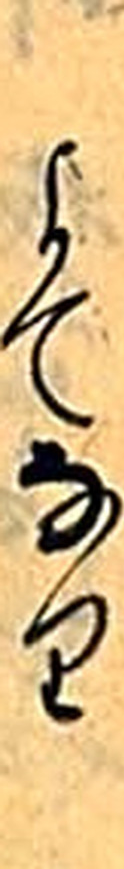よてなり
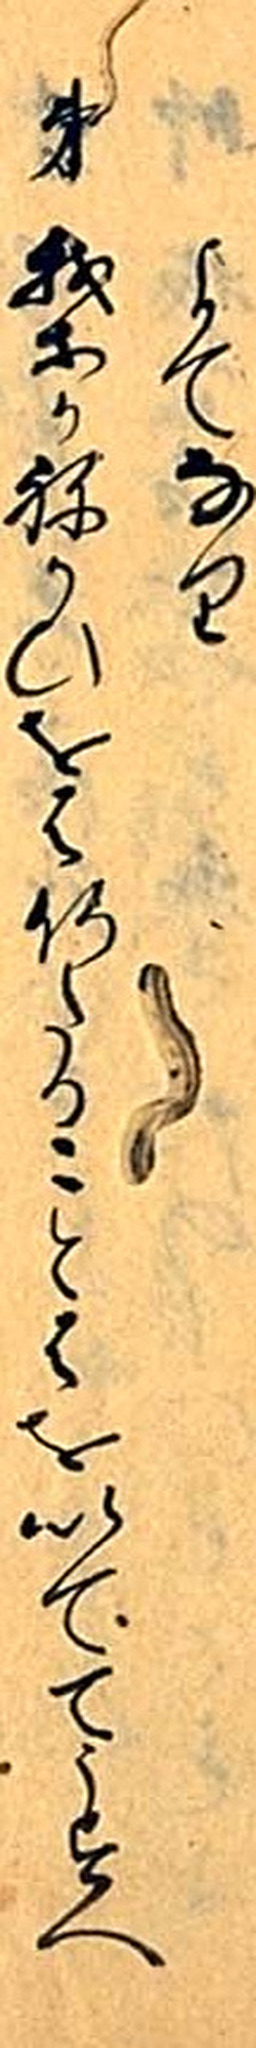弟我等かねかひをは何たることはを以ててうすへ
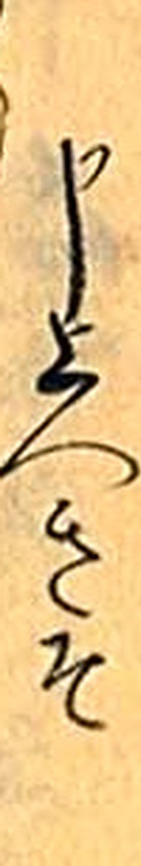申上へきそ
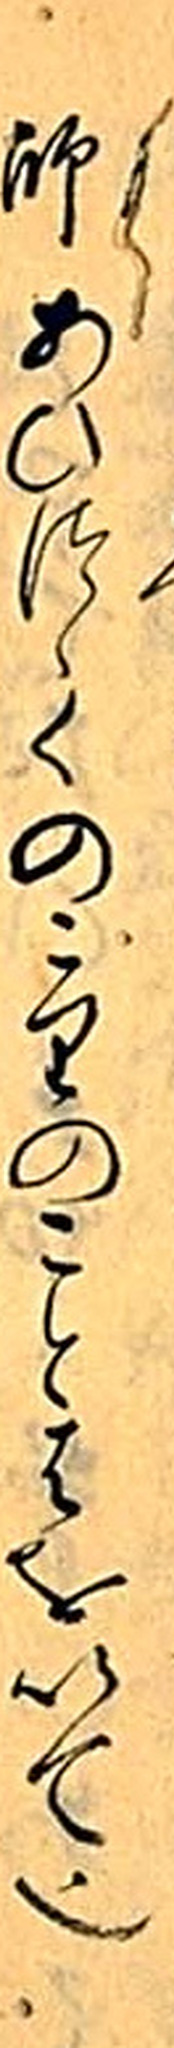師あひつゝくのこりのことはを以て也
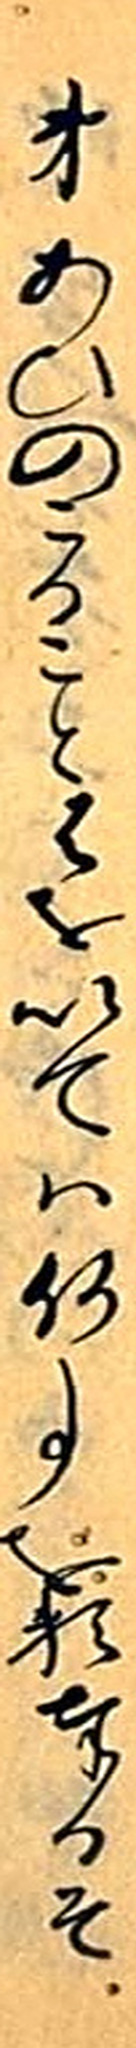弟あひのこることはを以ては何事を頼奉るそ
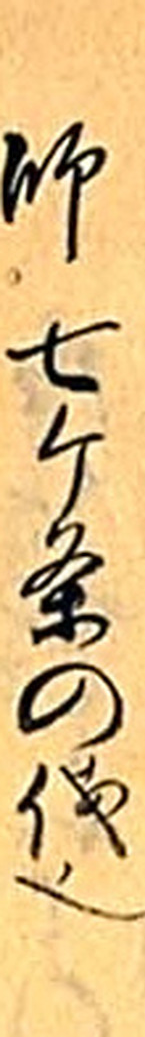師七ケ条の儀也
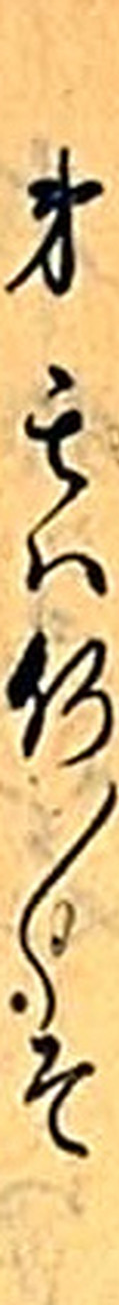弟其は何〳〵そ
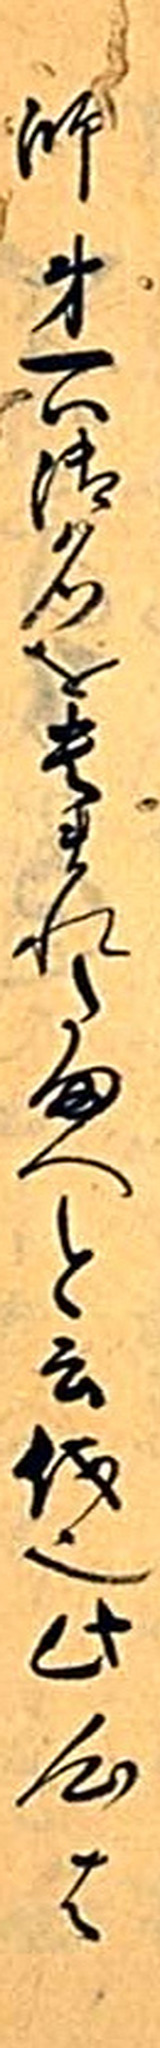師第一は御名を貴まれたまへと云儀也此心は
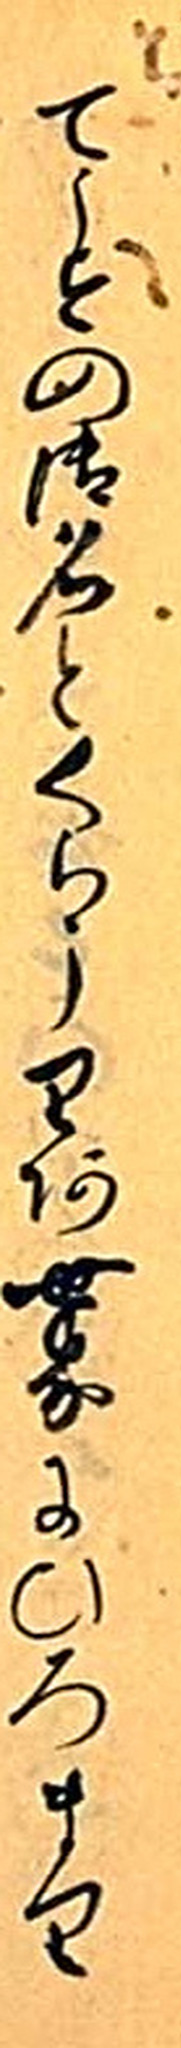てうすの御名とくらうりあ世界にひろまり
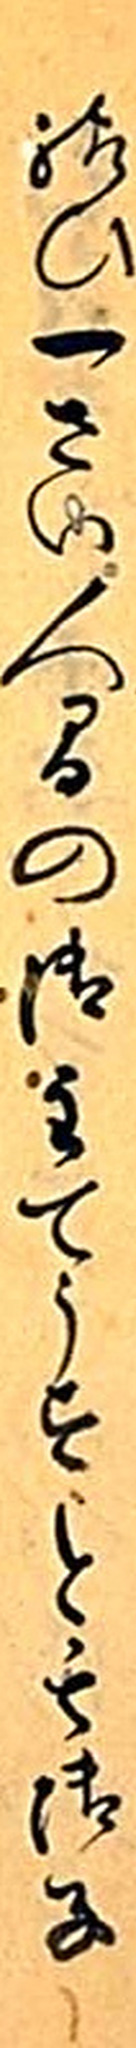給ひ一さい人間の御主てうすと其御子
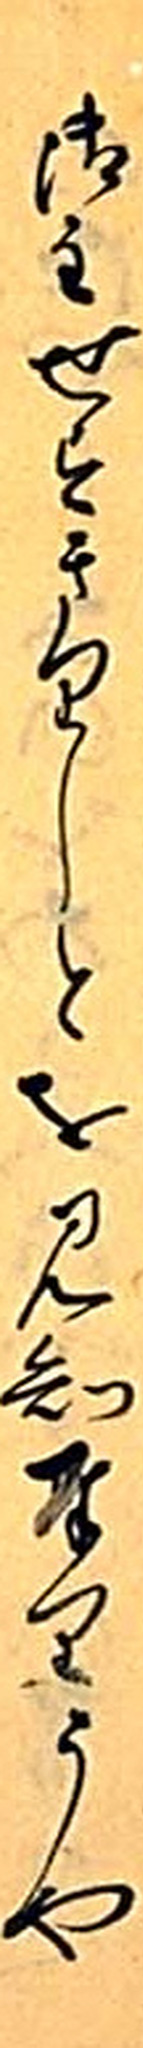御主せすきりしとを見知奉りうや
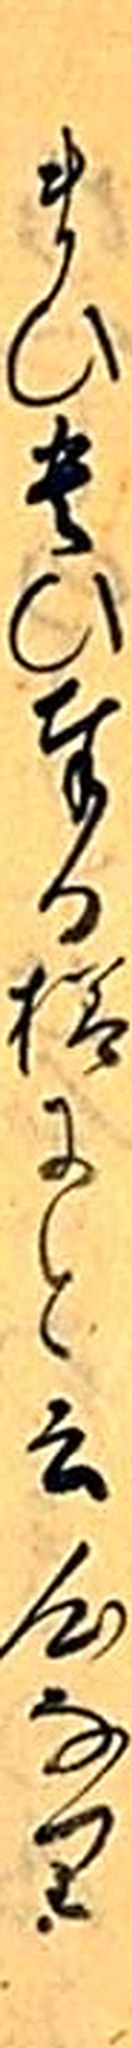まひ貴ひ奉る様にと云心なり
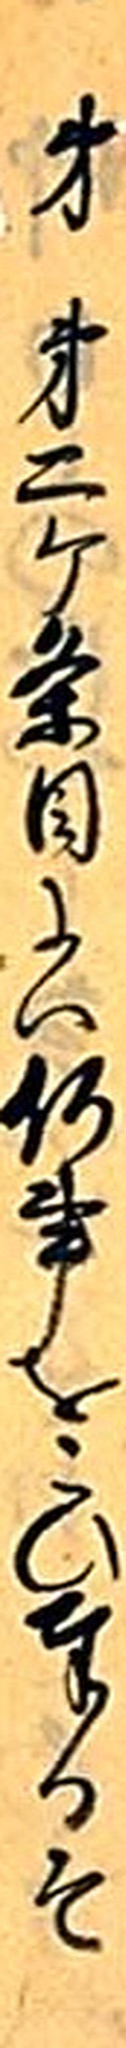弟第二ケ条目には何事をこひ奉るそ
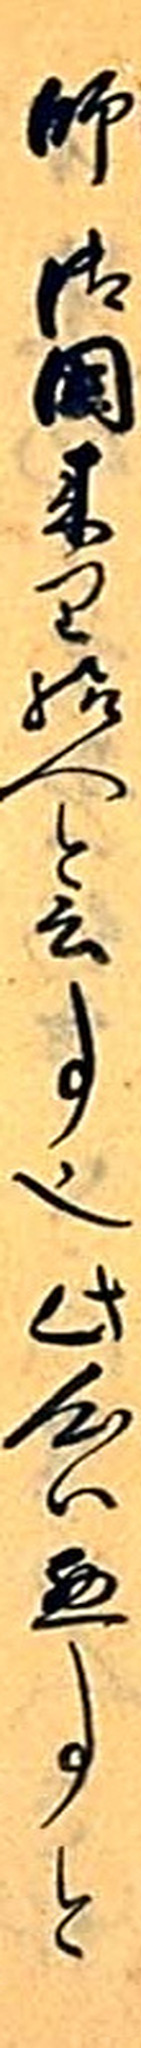師御国来り給へと云事也此心は悪事と
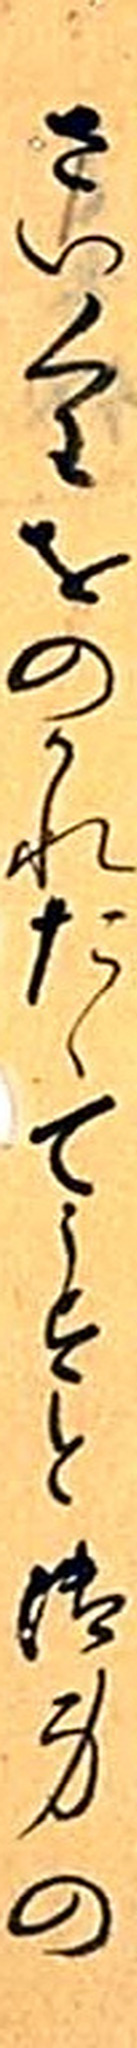さいくわをのかれたゝてうすと御身の
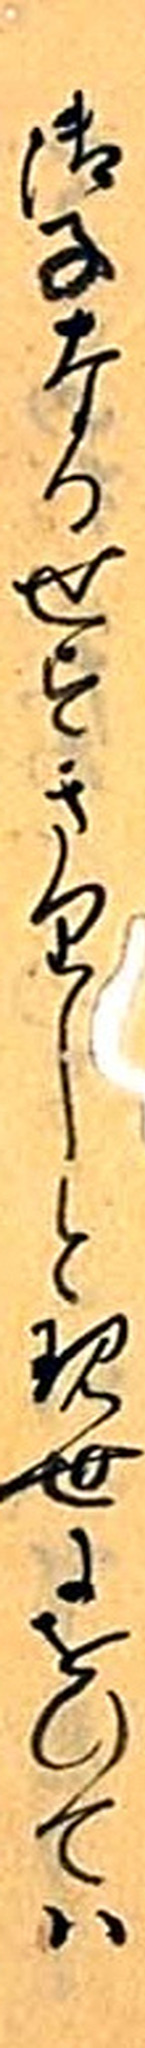御子なるせすきりしと現世にをひては
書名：ドチリナ・キリシタン
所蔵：東京大学総合図書館 / General Library in the University of Tokyo
